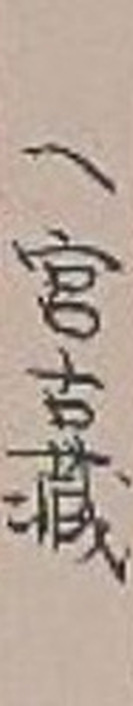ヘ宮古蔵
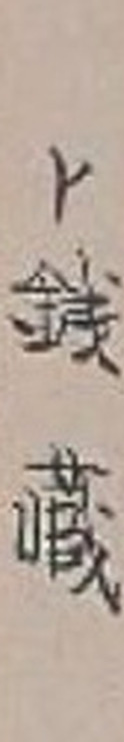ト銭蔵
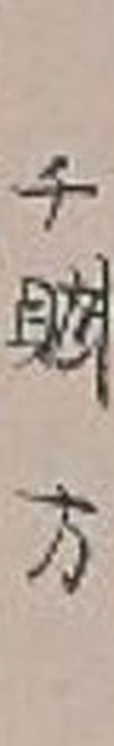チ賦方
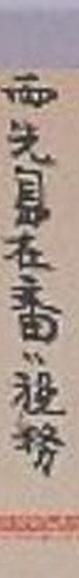両先島在番ハ税務
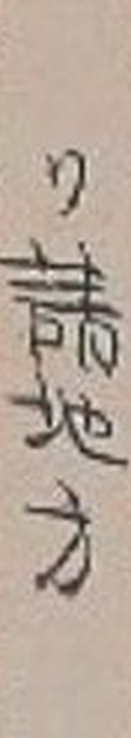リ請地方
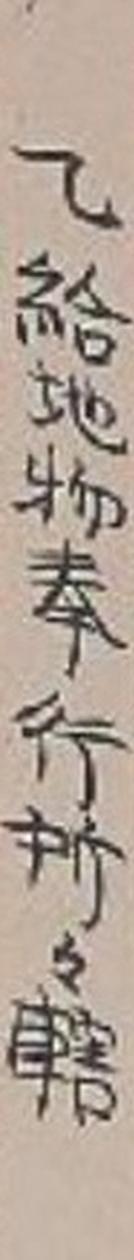乙給地物奉行所々轄
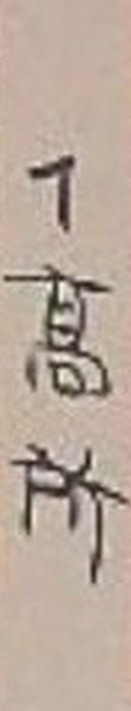イ高所
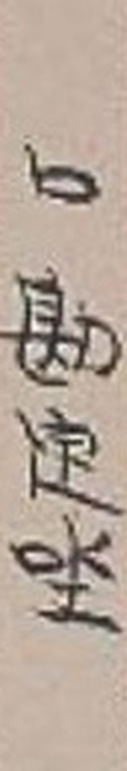ロ勘定坐
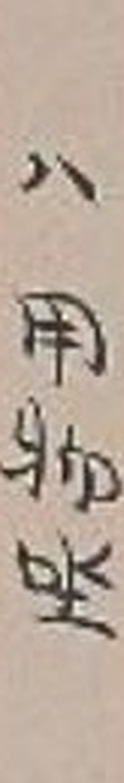ハ用物坐
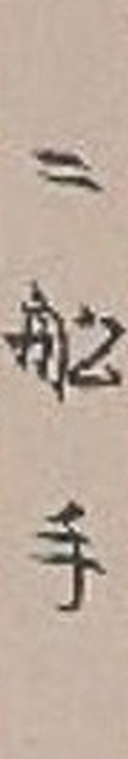ニ船手
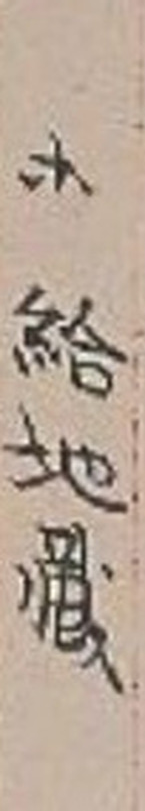ホ給地蔵
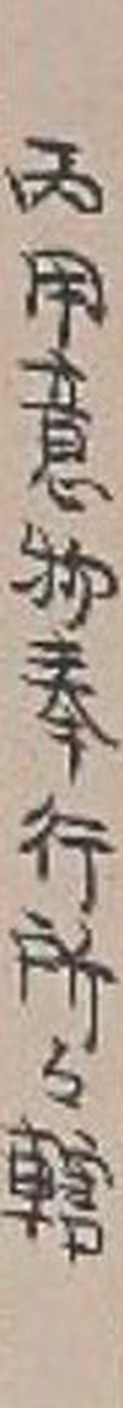丙用意物奉行所々轄
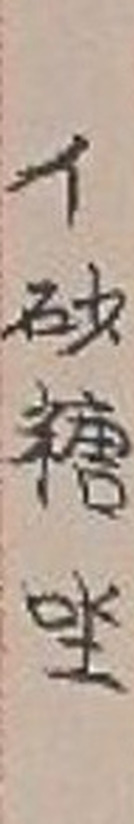イ砂糖坐
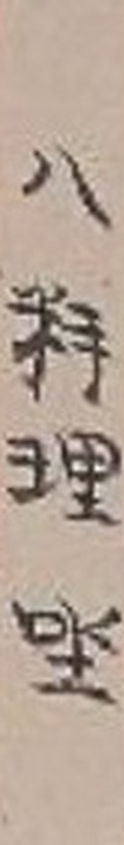ハ料理坐
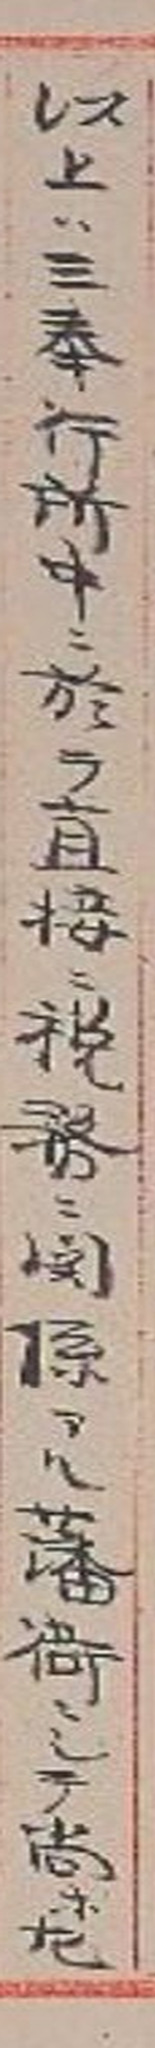以上ハ三奉行所ニ於テ直接ニ税務ニ関係アル藩衙ニシテ尚ホ左
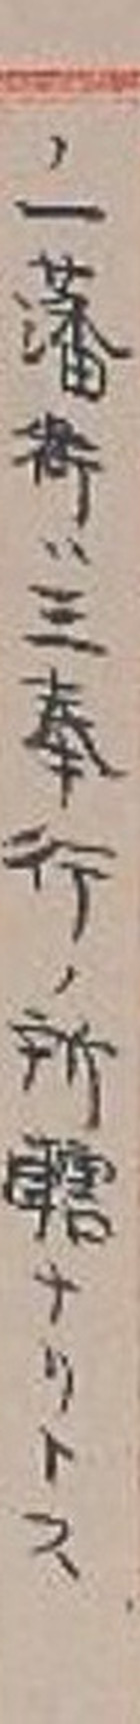ノ一藩衙ハ三奉行ノ所轄ナリトス
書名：旧藩中租税徴収ニ関スル事項
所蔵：University of the Ryukyus Library
